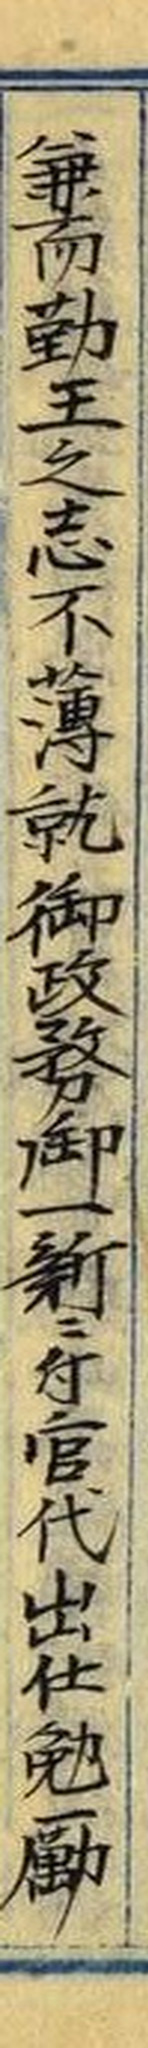兼而勤王之志不薄就御政務御一新ニ付官代出仕勉励

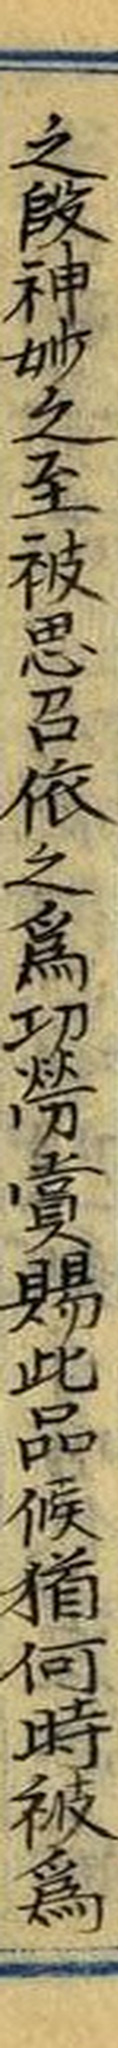之段神妙之至被思召依之為功労賞賜此品候猶何時被為
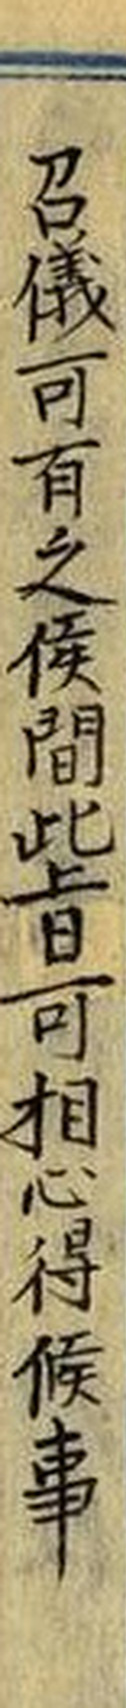召儀可有之候間此旨可相心得候事
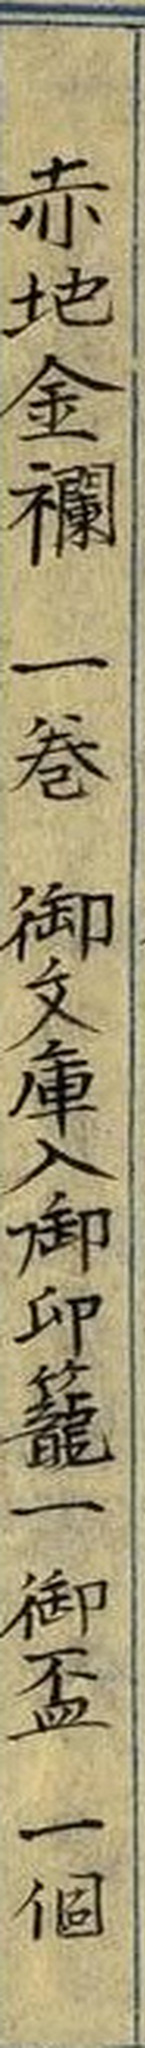赤地金欄一巻御文庫入御印籠一御盃一個
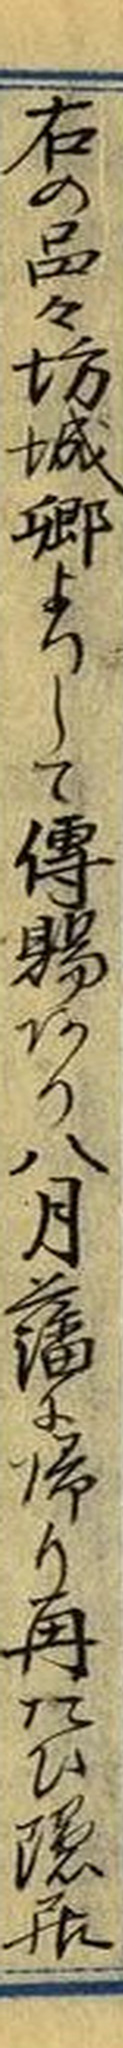右の品々坊城卿よりして伝賜なり八月藩に帰り再たひ隠居
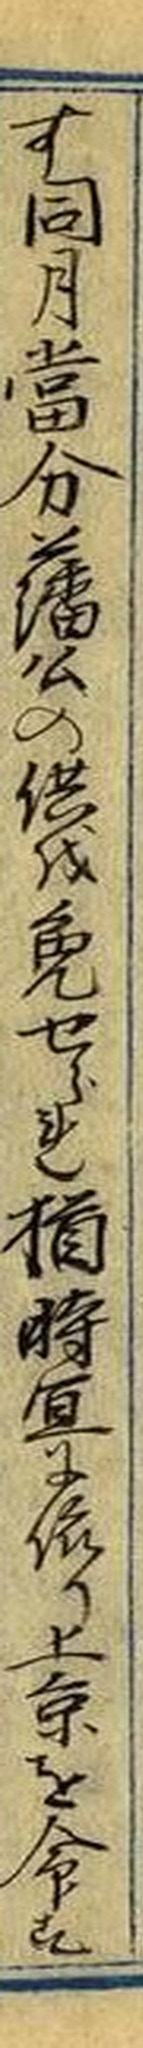す同月当分藩公の供を免せられ猶時宜に依り上京を命す
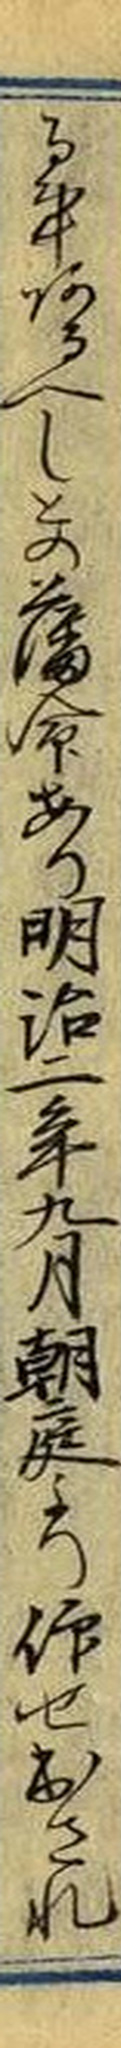る事あるへしとの藩命あり明治二年九月朝廷より仰せ出され
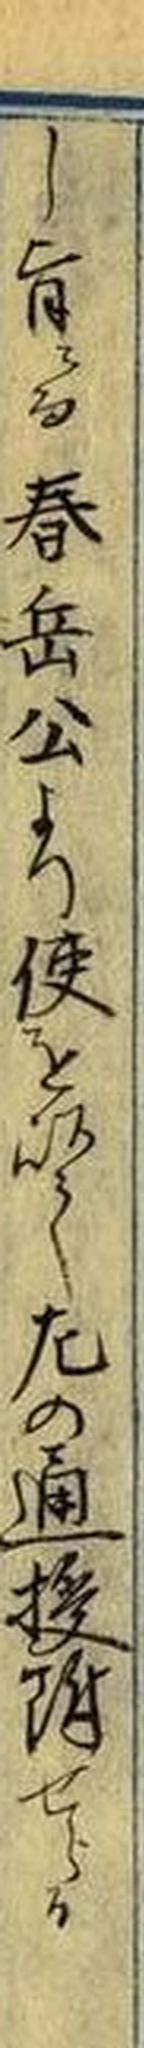し旨ニ而春岳公より使を以て左の通授附せらる
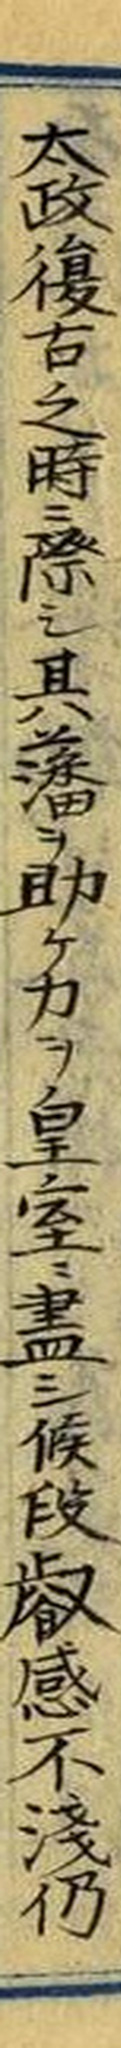太政複古之時ニ際シ其藩ヲ助ヶ力ヲ皇室二尽シ候段叡感不浅仍
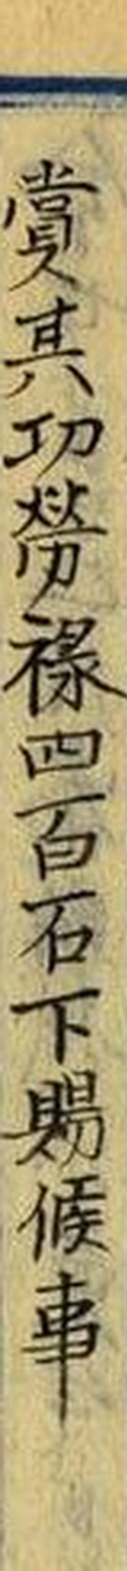賞其功労禄四百石下賜候事
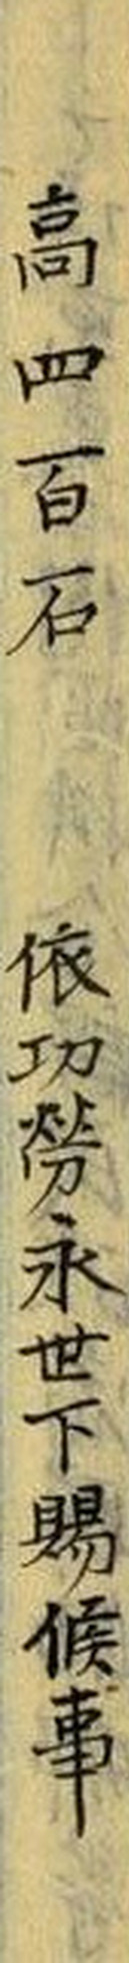高四百石依功労永世下賜候事
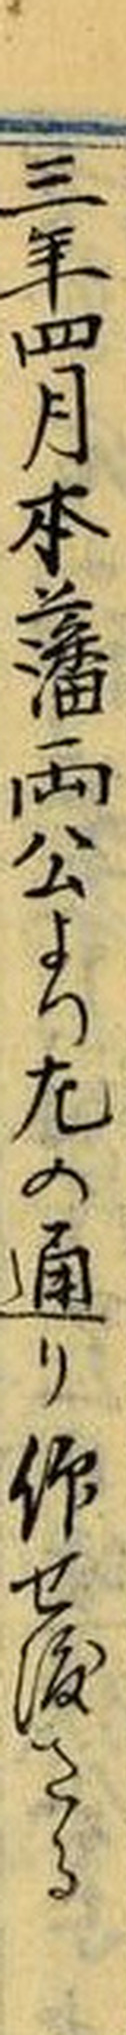三年四月本藩両公より左の通り仰せ渡さる
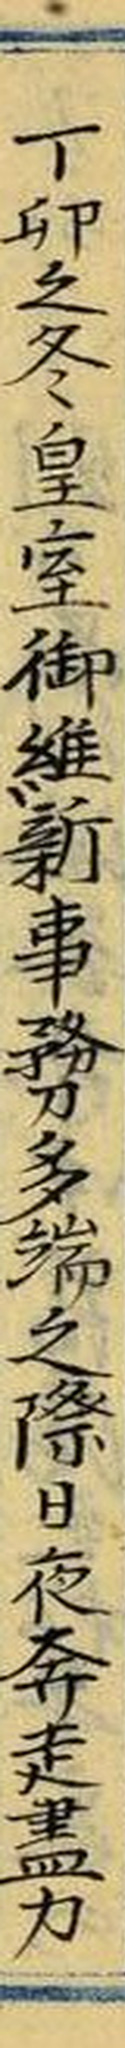丁卯之冬皇室御維新事務多端之際日夜奔走尽力
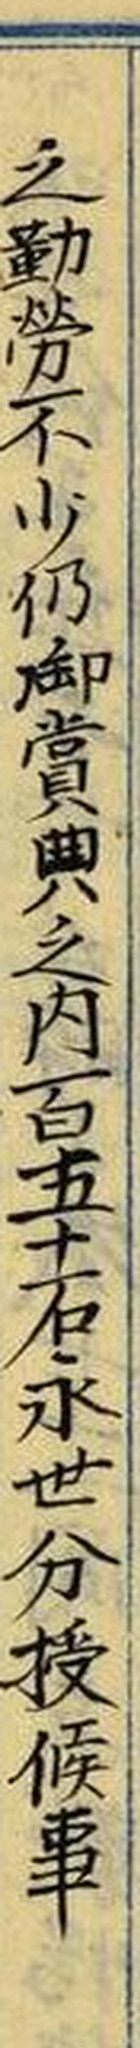之勤労不少仍御賞典之内百五十石永世分授候事
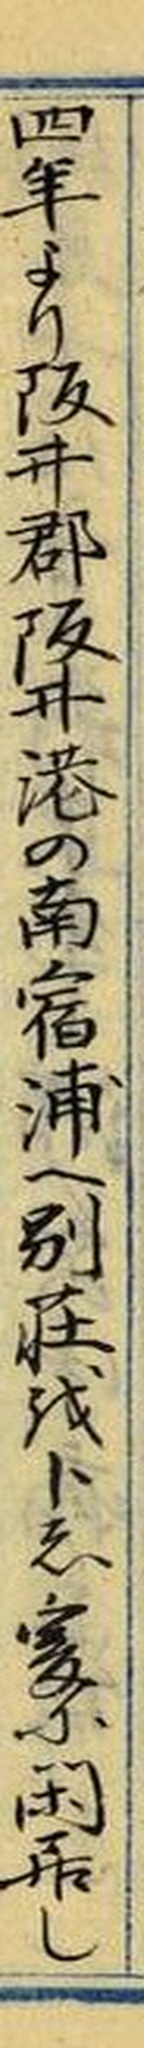四年より阪井郡阪井港の南宿浦へ別荘を卜し爰に閑居
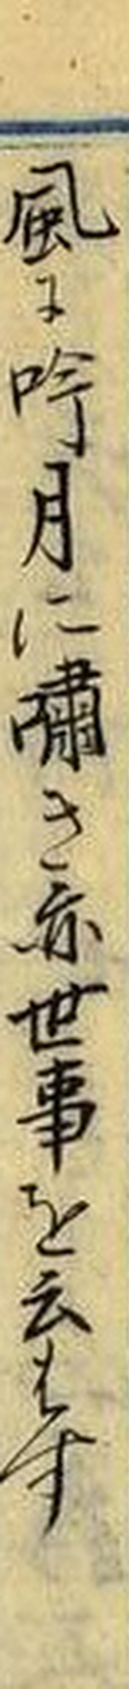風に吟月に嘯き亦世事を云はす
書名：温古集 三巻
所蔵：福井県文書館 Fukui Prefectural Archives
